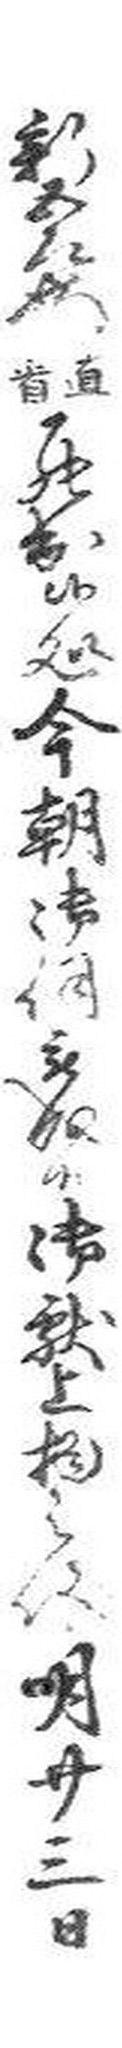新五左衛門直看罷出候処今朝御伺被成候御献上物之儀明廿三日
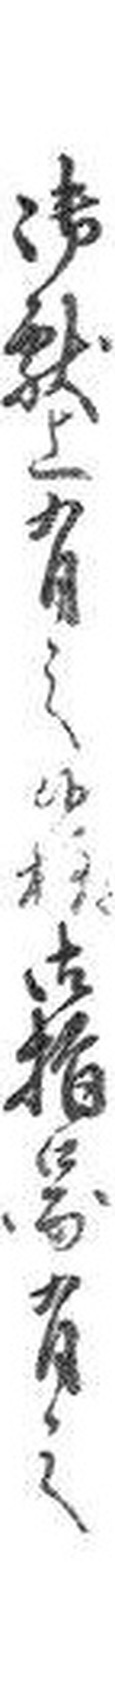御献上有之候様御指図有之
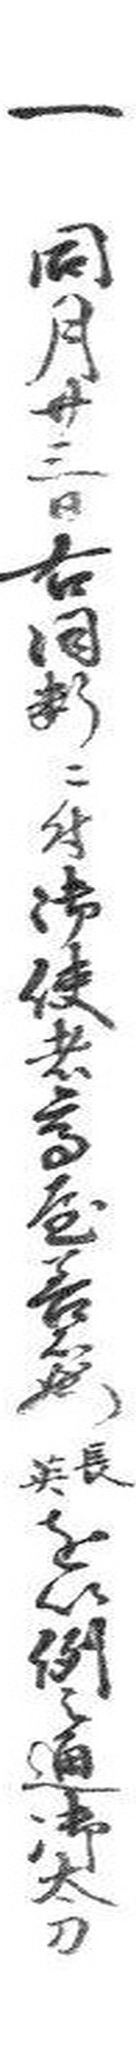一同月廿三日右同断ニ付御使者高屋善右衛門長英を以例之通御太刀
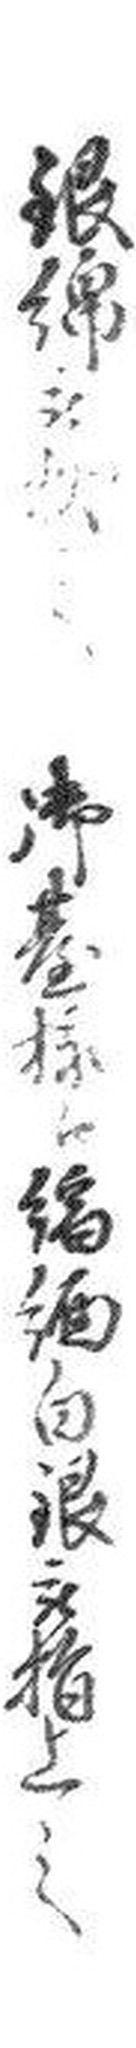銀綿被献之御台様江縮緬白銀被指上之
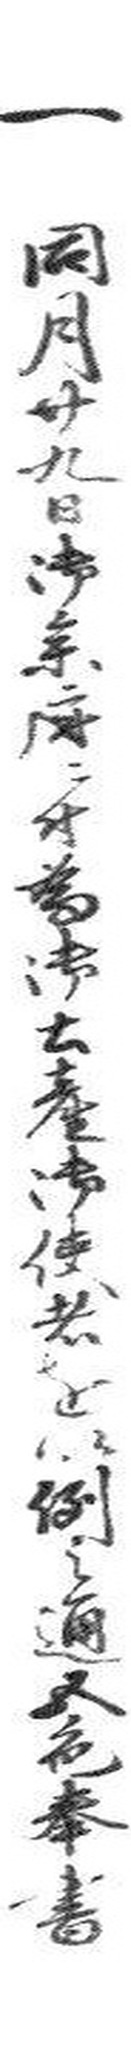一同月廿九日御参府ニ付為御土産御使者を以例之通五色奉書
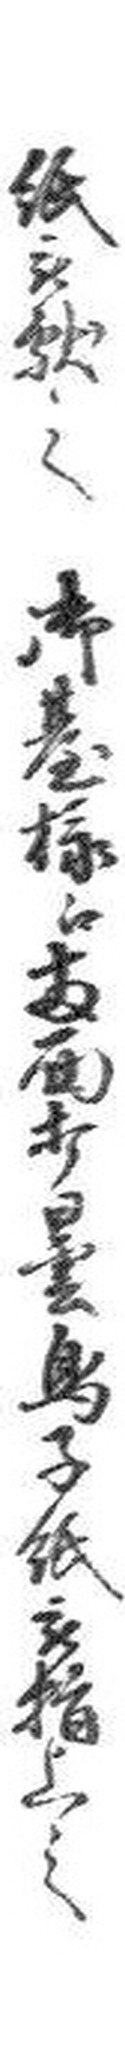紙被献之御台様江両面打曇鳥子紙被指上之
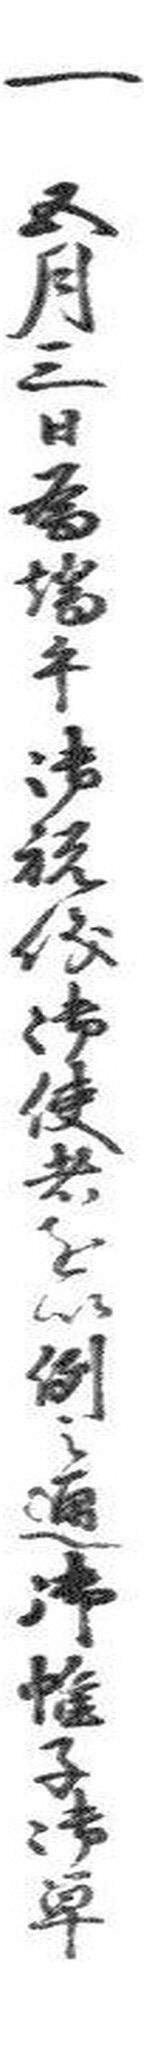一五月三日為端午御祝儀御使者を以例之通御帷子御単
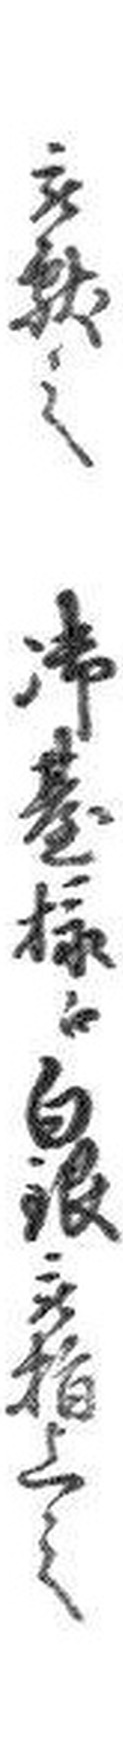被献之御台様江白銀被指上之
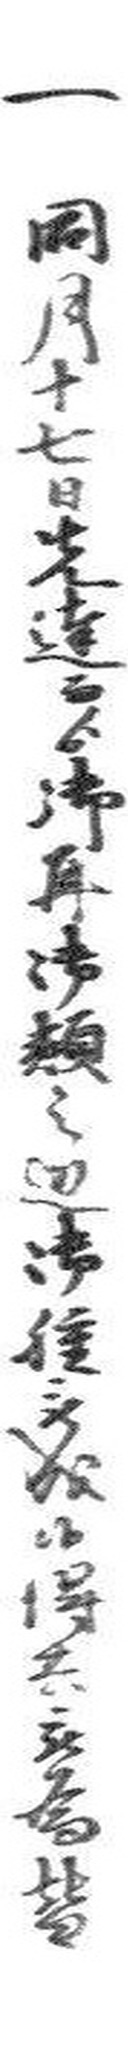一同月十七日先達而ゟ御耳御頬之辺御腫被成候得共被為替
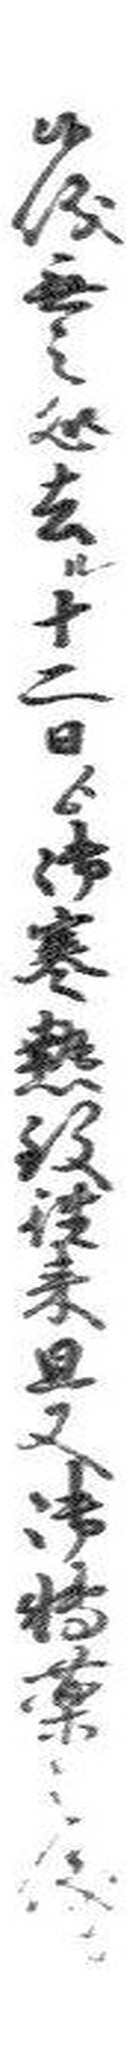候儀無之処去ル十二日ゟ御寒熱致往来且又御持薬之儀
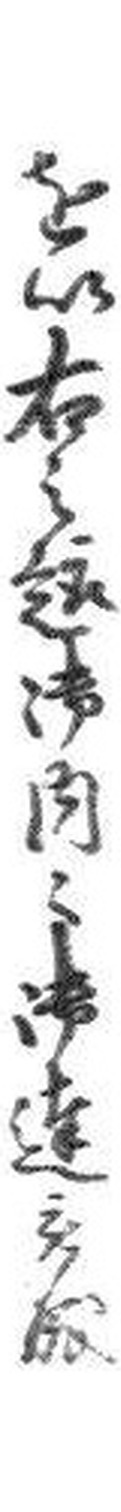を以右之趣御内々御達被成
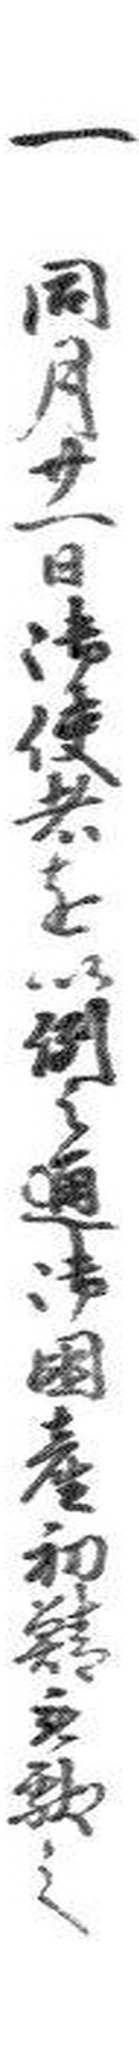一同月廿一日御使者を以例之通御国産初鯖被献之
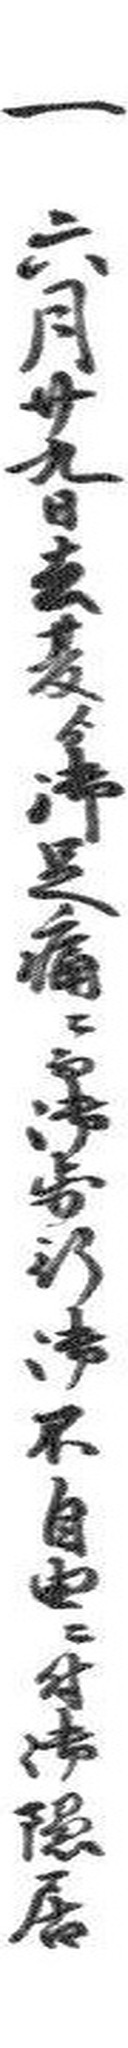一六月廿九日去夏ゟ御足痛ニ而御歩行御不自由ニ付御隠居

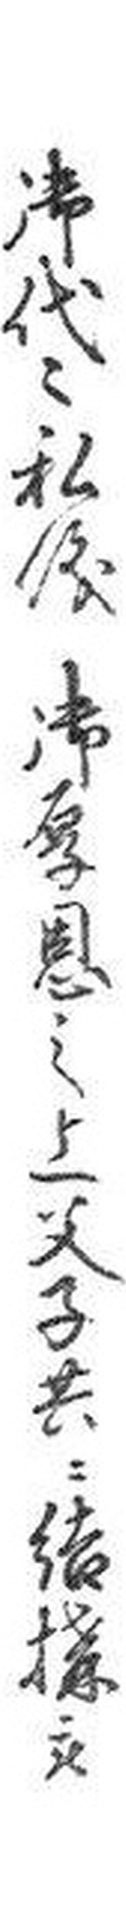御代々私儀御厚恩之上父子共ニ結構被
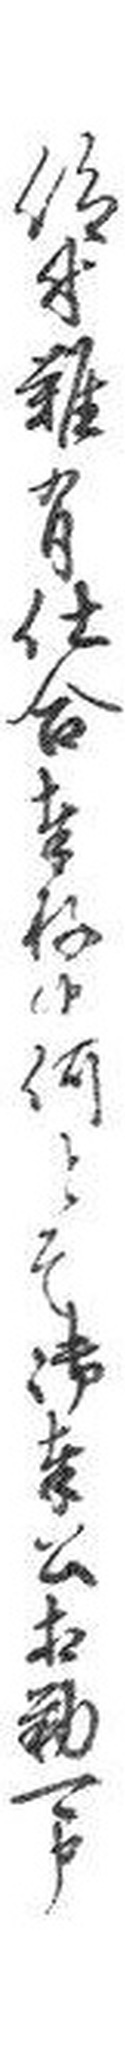仰付難有仕合奉存候何とそ御奉公相勤可申
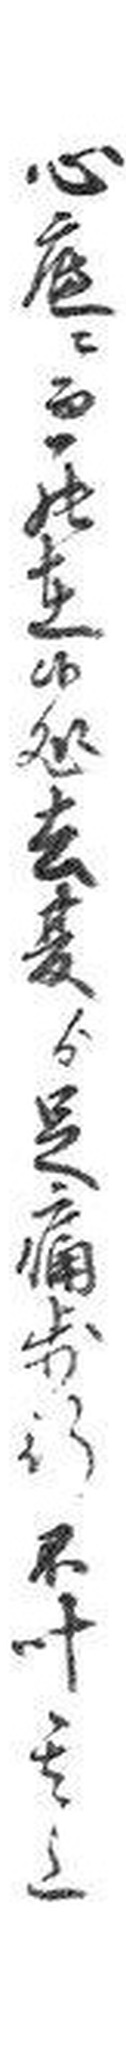心底ニ而罷在候処去夏ゟ足痛歩行不叶其上
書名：家譜 二十五 吉品公 従宝永六年到同七年
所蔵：福井県文書館 Fukui Prefectural Archives
